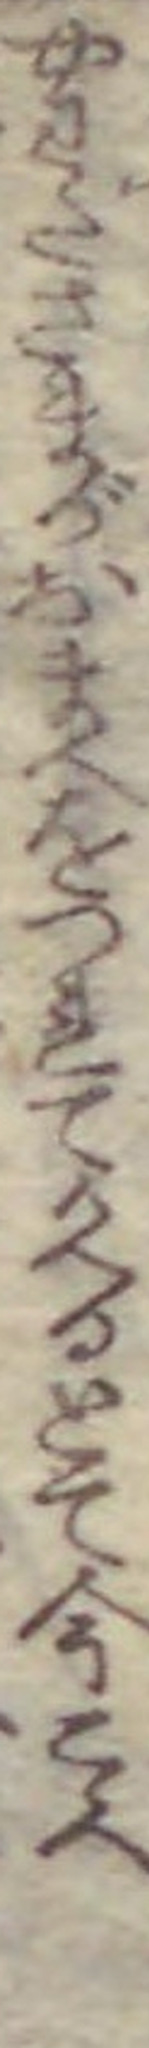やわたさまがおまへをつれてかへるとて今こゝへ
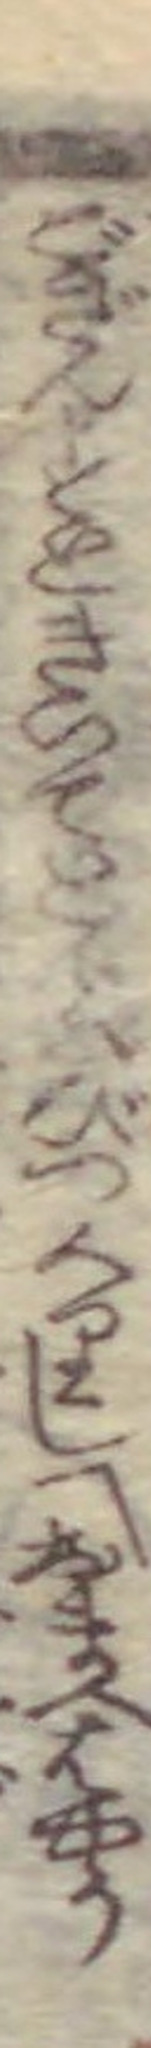ござんすときいてとらはびつくりし〽おまへはやう
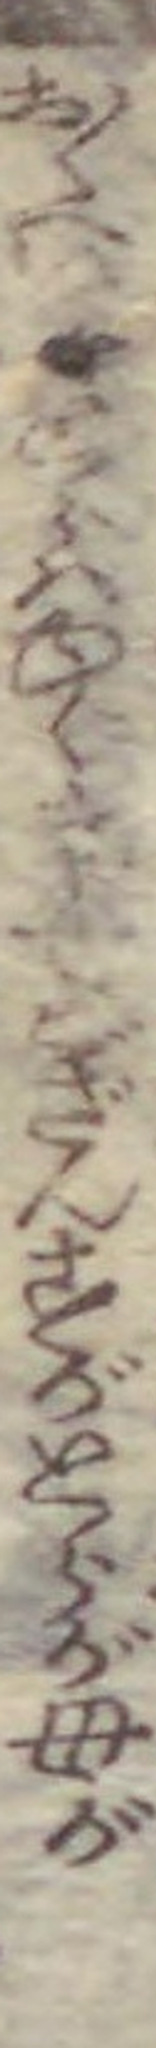おくへいてとらはゆくきでござんすがとらが母が
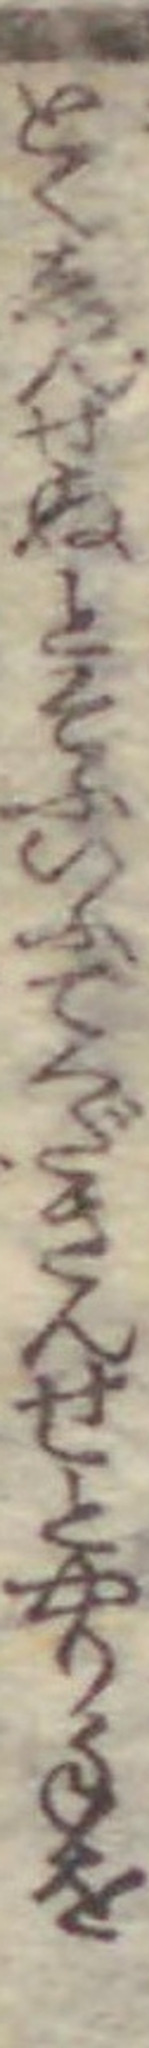とくしんせぬとそふいふてくださんせとやり手を
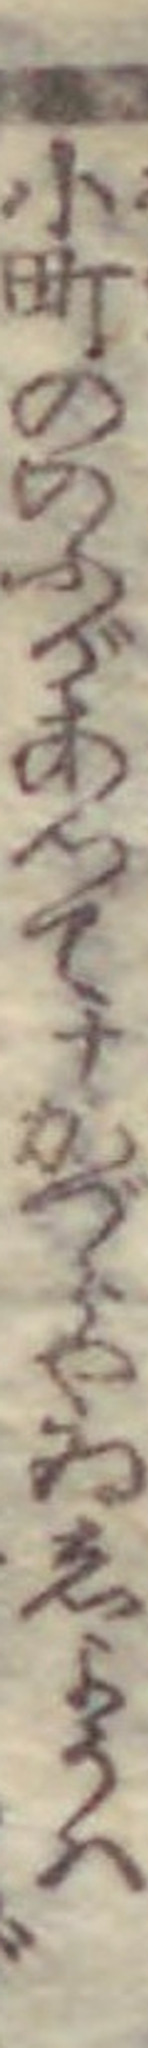小町ののふがあつてナかづらやゐしようは
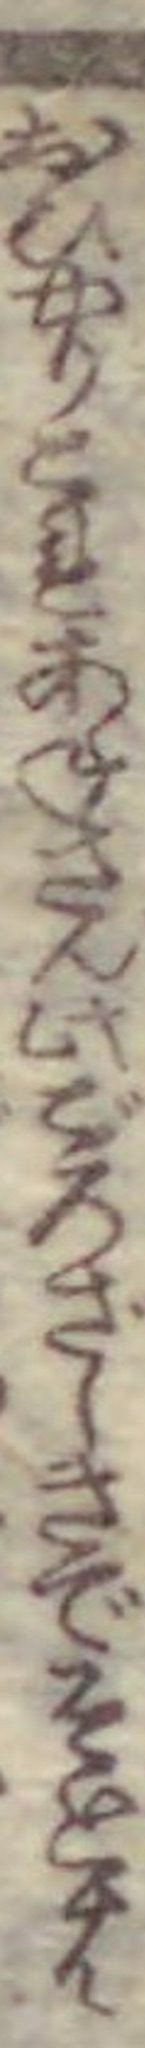おひやりこれあねさん此ごろざしきでそとは
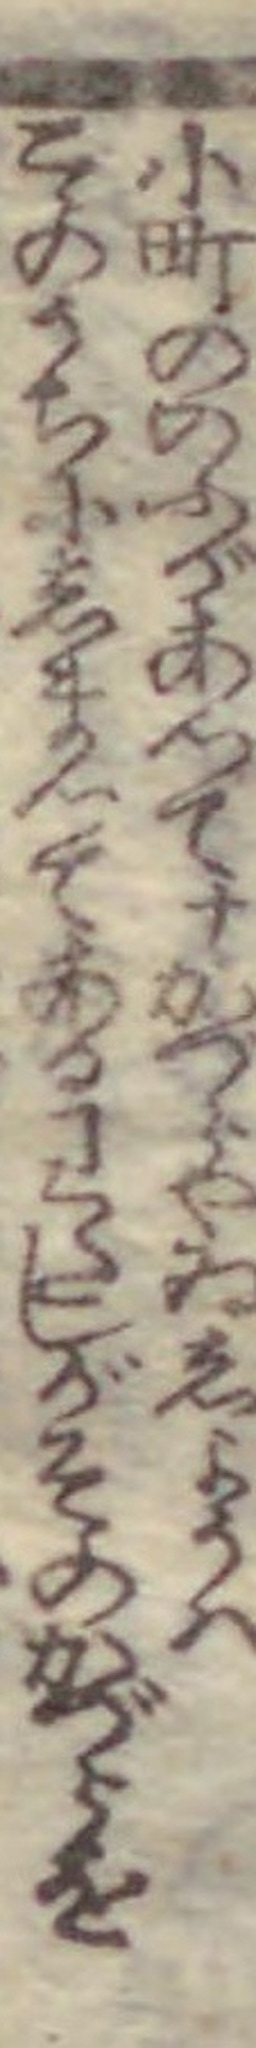このうちにしまつてあるわたしがそのかづらを
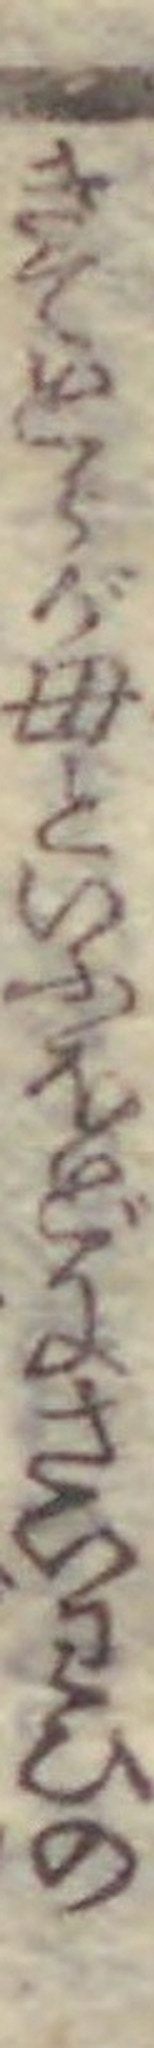きてとらが母といふほどにさいわひの
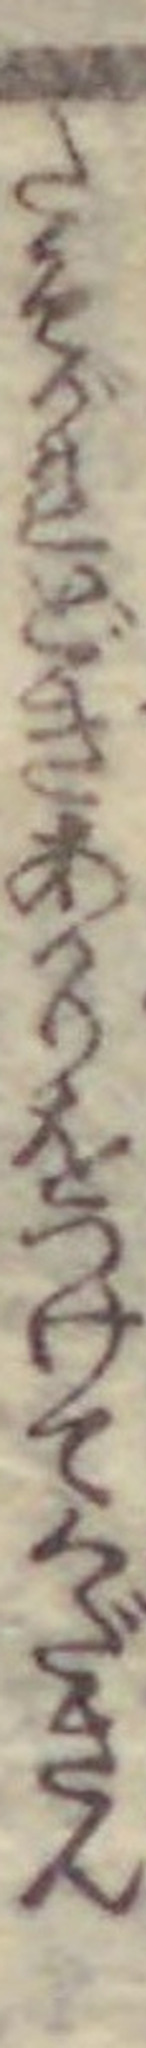たそがれどきあかりをつけてくださん
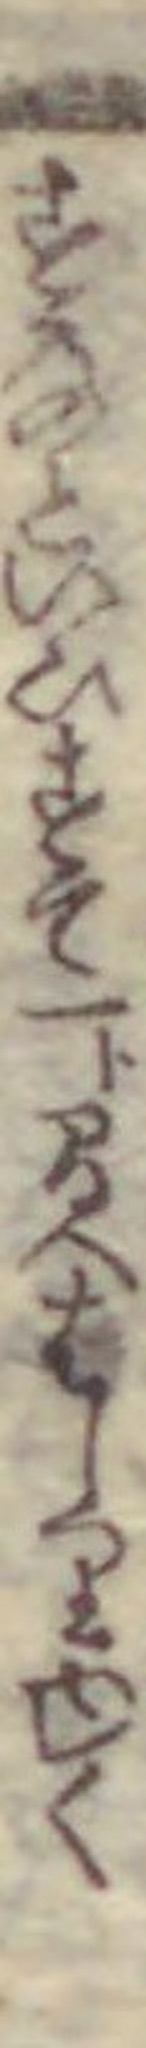すなといひすて一間へはしりゆく
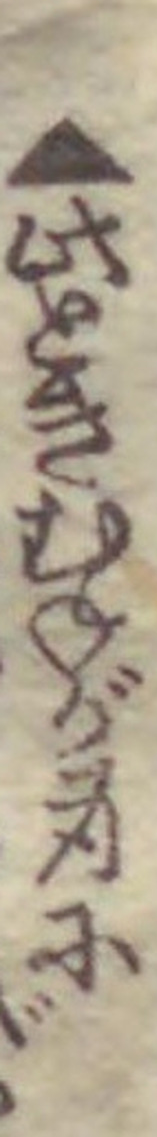▲此ときむねが身に
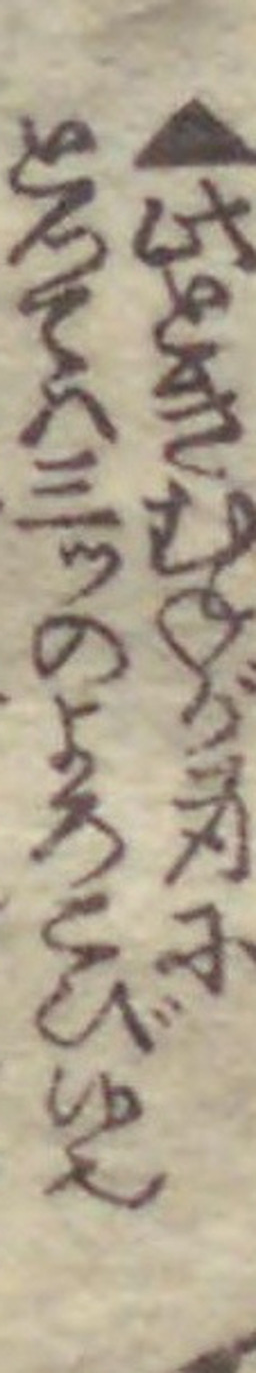とつては三つのよろこび候也
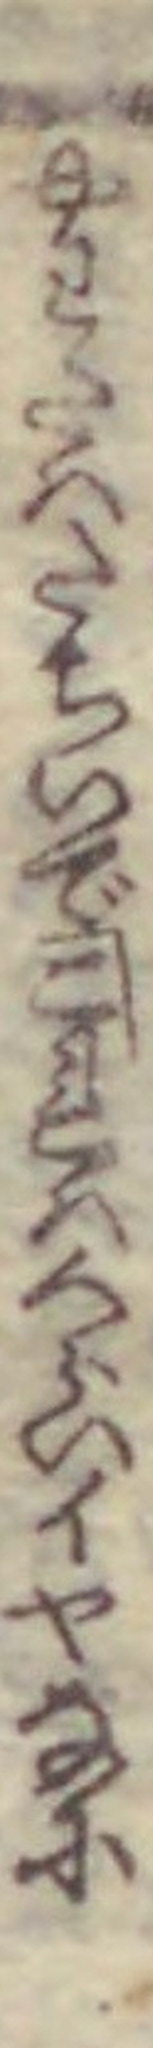やわたはたちいで〽これはくらいイヤなに
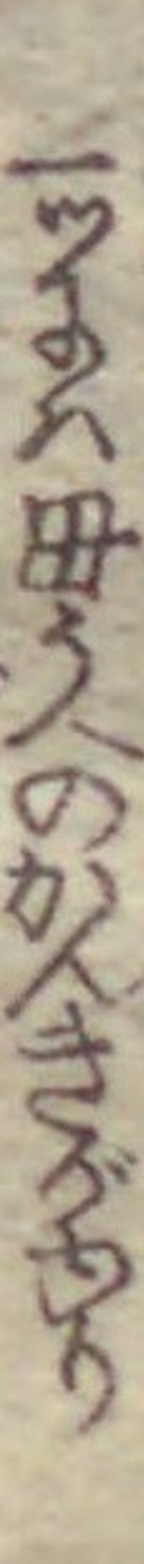一つには母うへのかんきがゆり
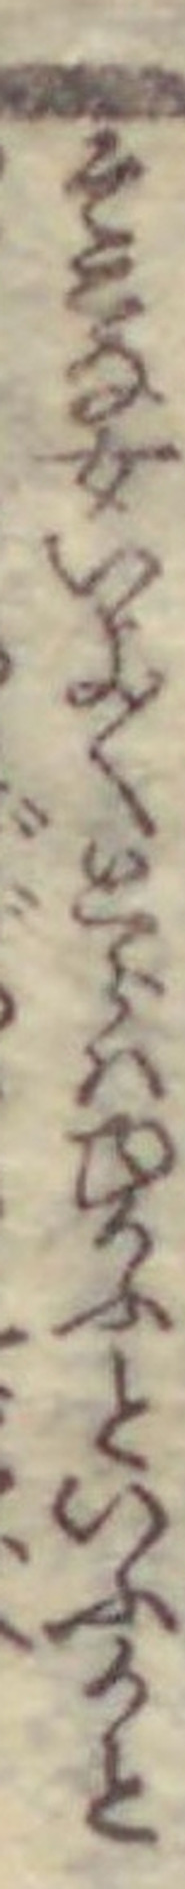そこな女いよ〳〵とらはゆかふといふかと
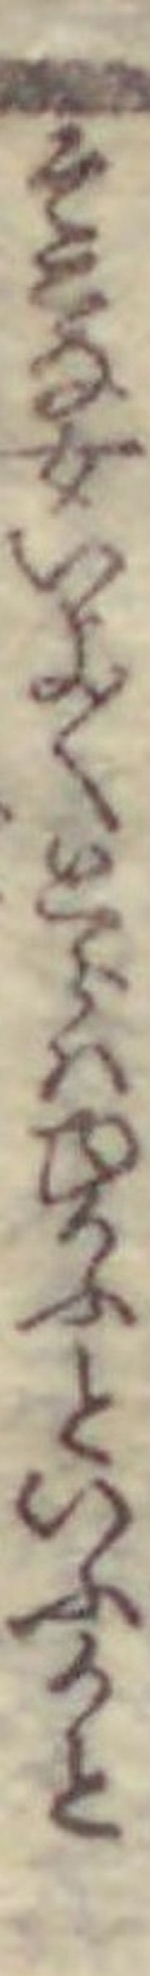そこな女いよ〳〵とらはゆかふといふかと
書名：大時代唐土化物 3巻. 曽我太夫染
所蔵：国立国会図書館 National Diet Library, JAPAN
